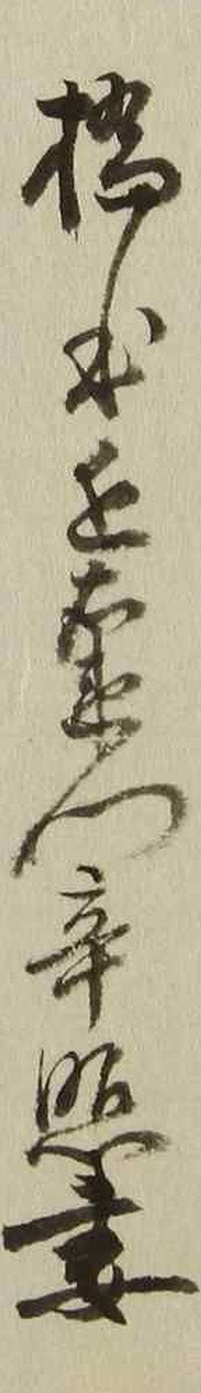女橋本近右衛門辛照妻
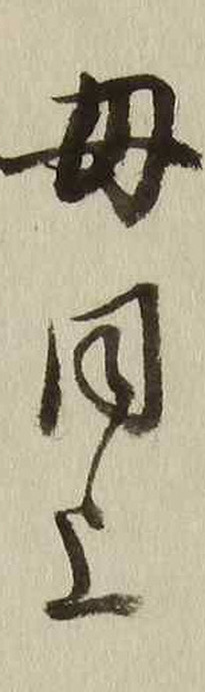母同上
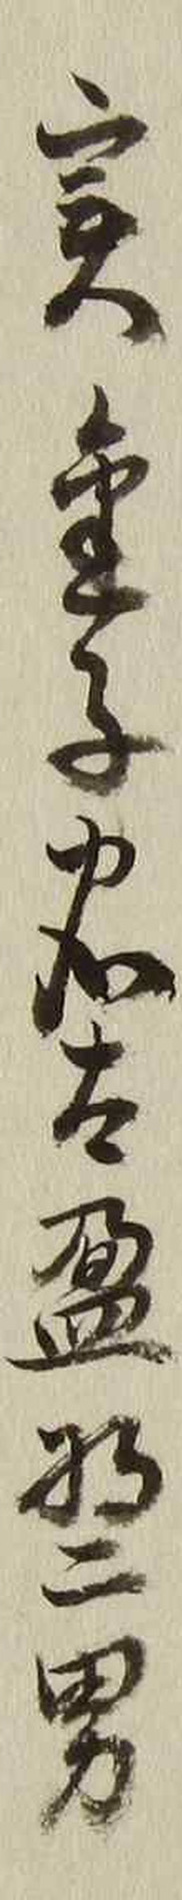実金子忠太盈将二男
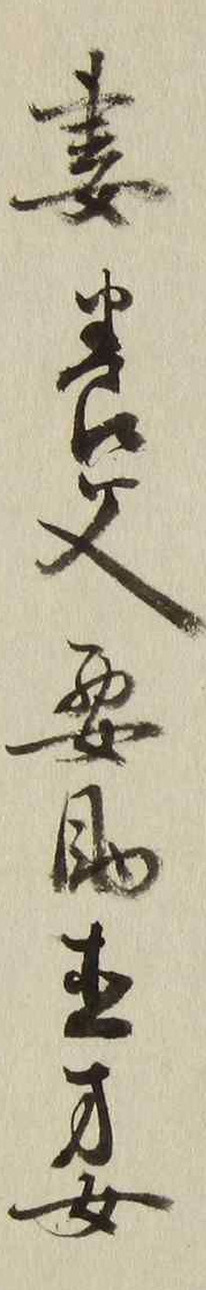妻養父要助直方女
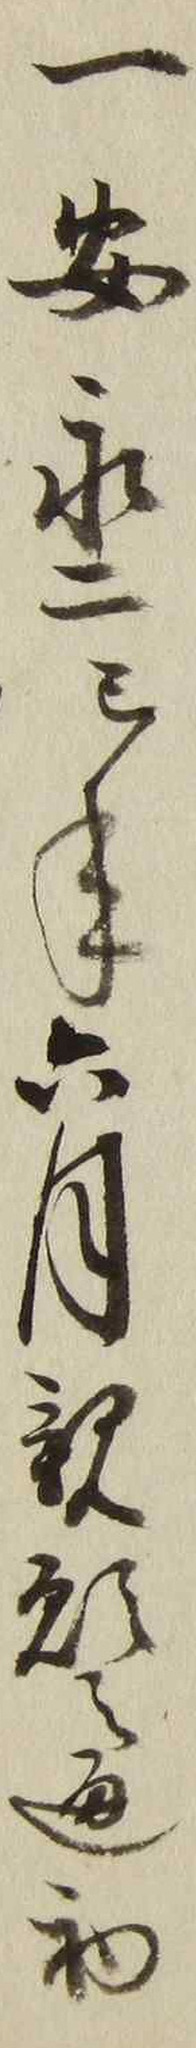一安永二巳年六月親願之通初
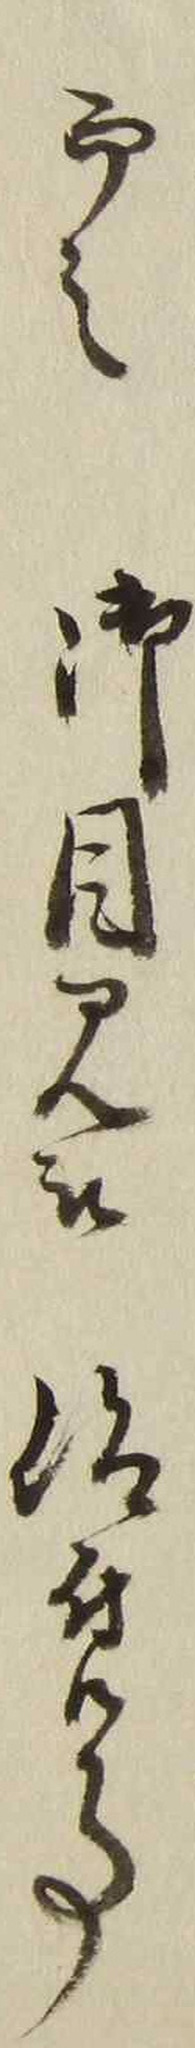而之御目見被仰付候事
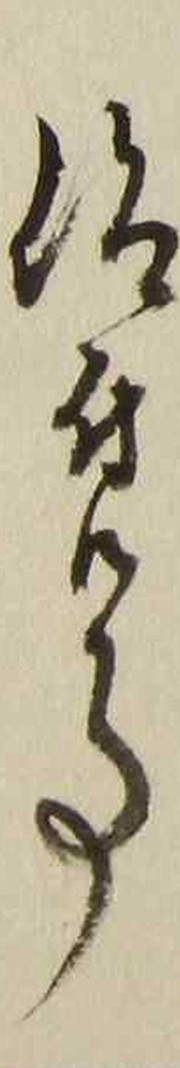仰付候事

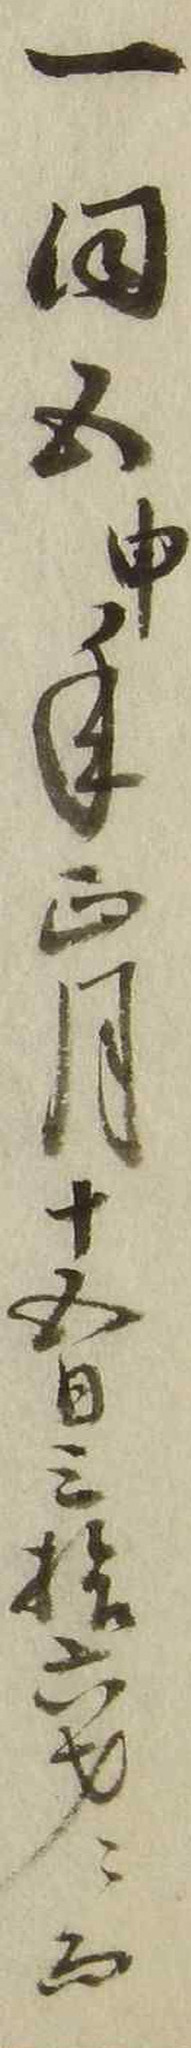一同五申年正月十五日三拾六才ニ而
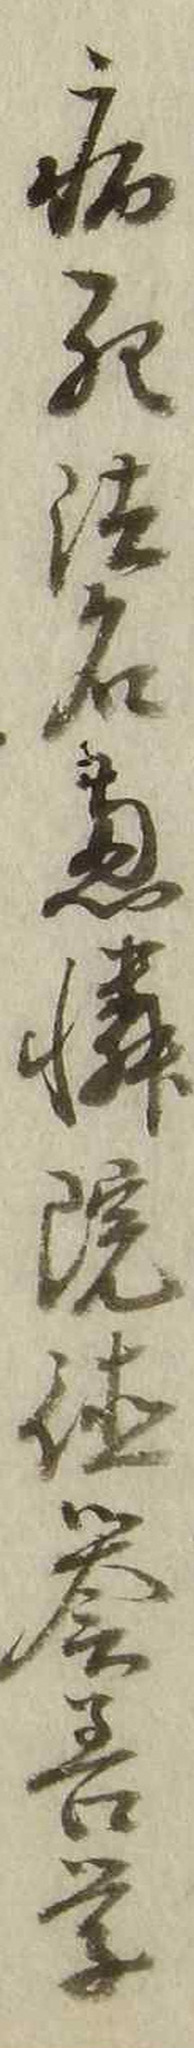病死法名恵憐院徳誉善学
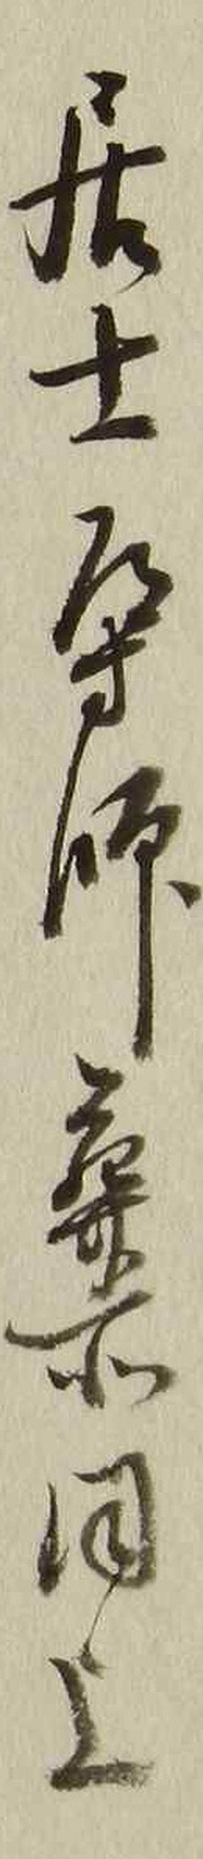居士導師葬所同上
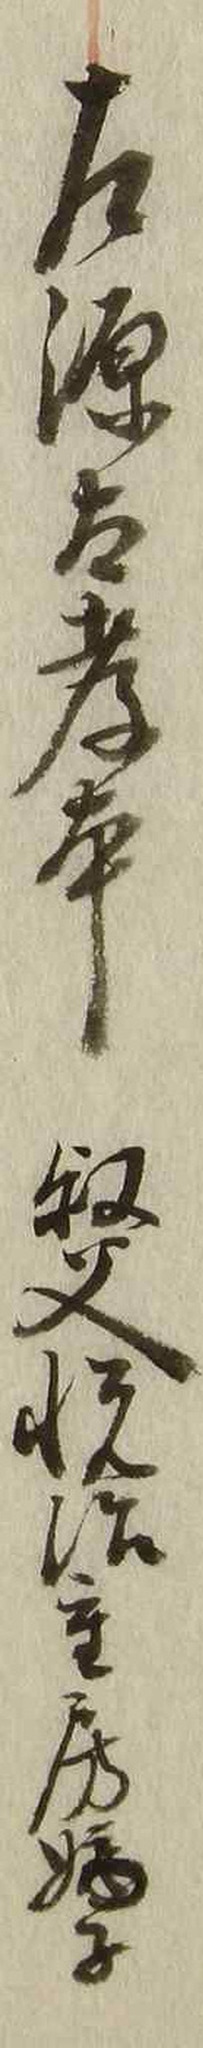左源太孝本叔父悦治重房嫡子
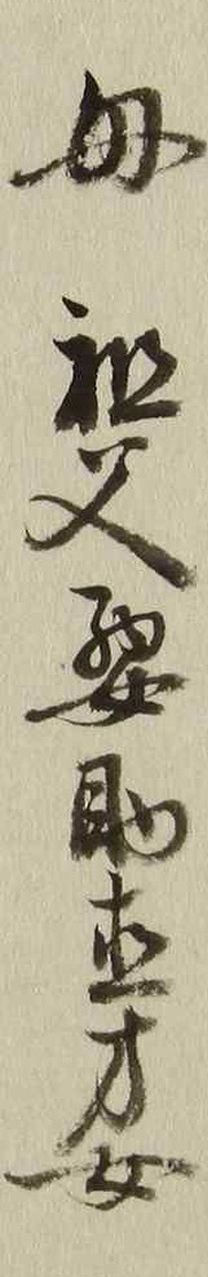母祖父要助直方女
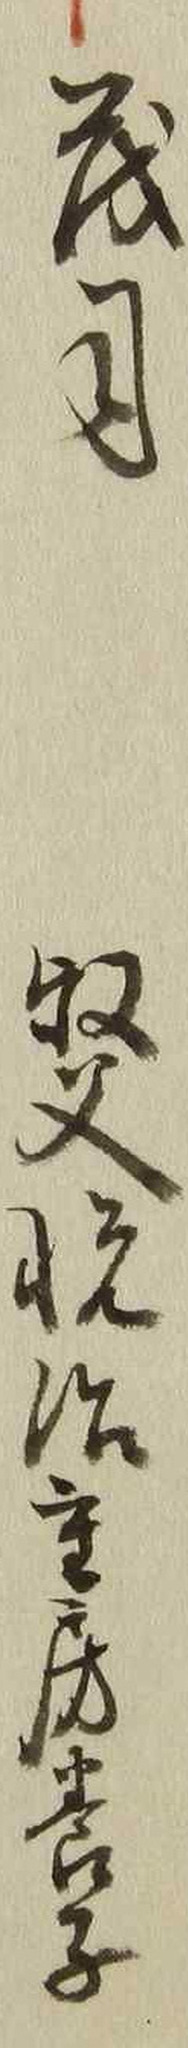茂司叔父悦治重房養子
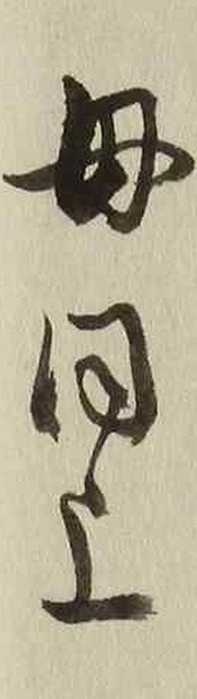母同上
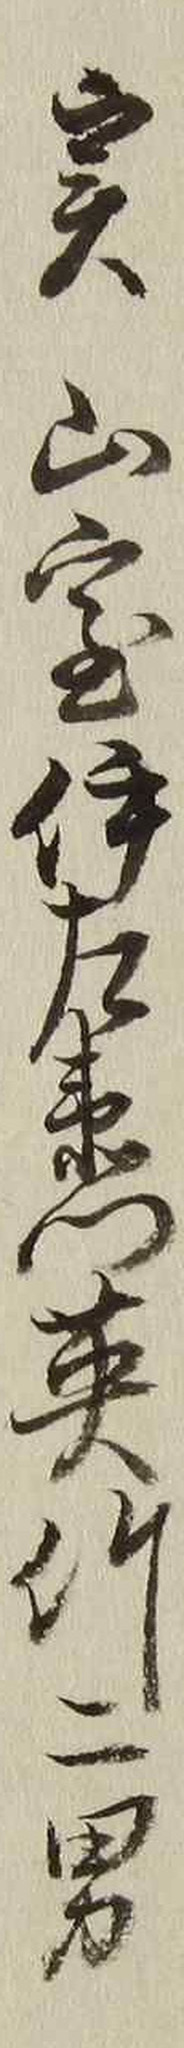実山室伊左衛門英竹二男
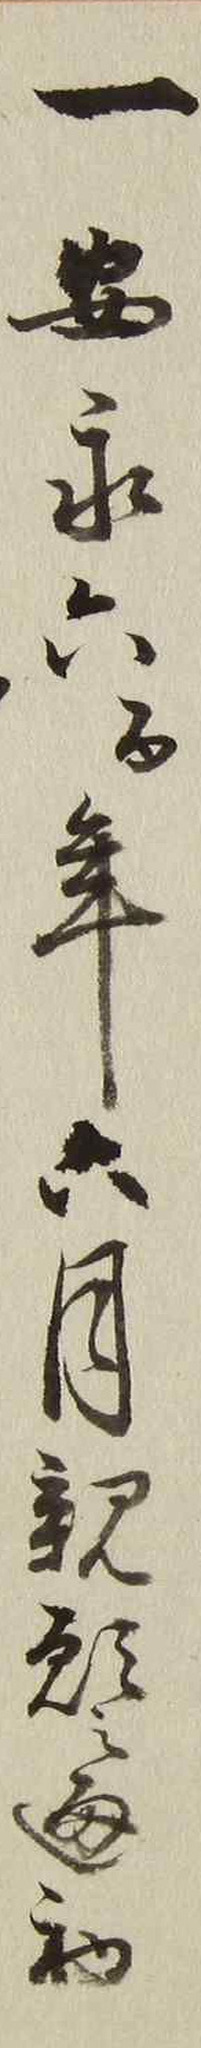一安永六酉年六月親願之通初
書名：諸士系譜　巻之53　に之部4
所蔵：会津若松市立会津図書館
